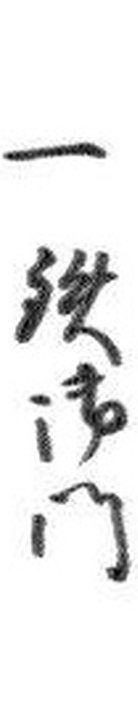一鉄御門
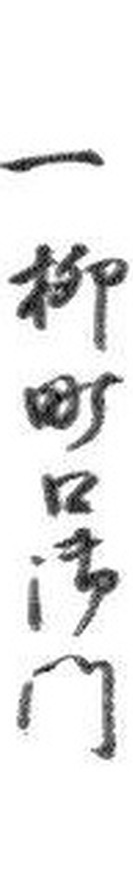一柳町口御門

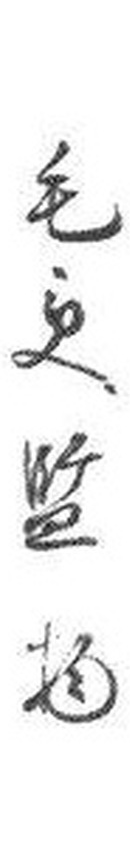毛受監物
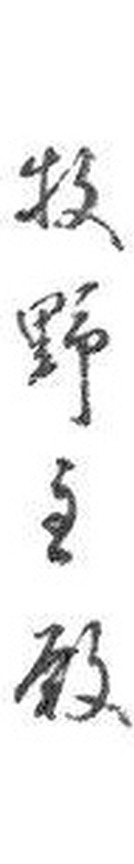牧野主殿
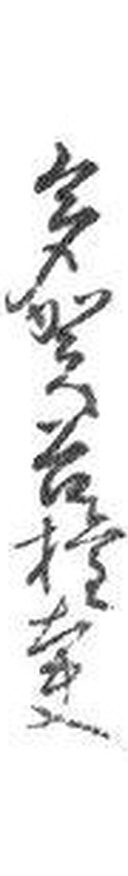多賀谷権太夫
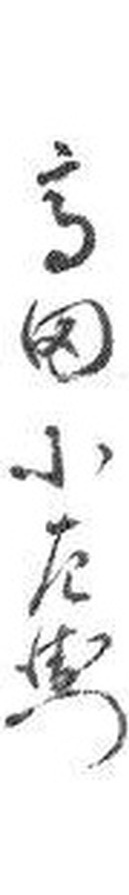高田小左衛門
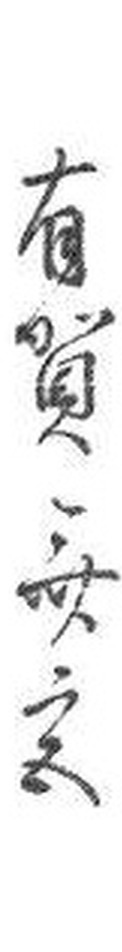有賀斎宮
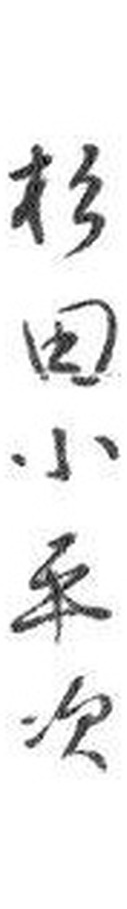杉田小平次
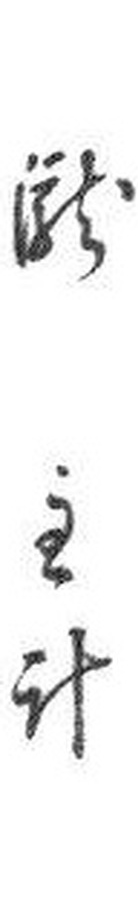瀧主計
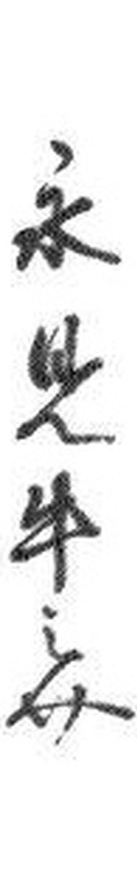永見牛之介
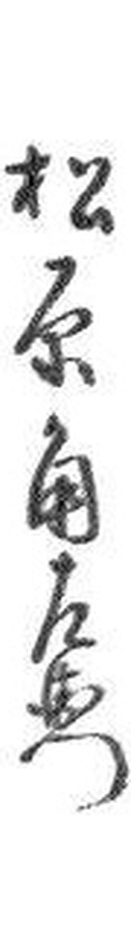松原角左衛門
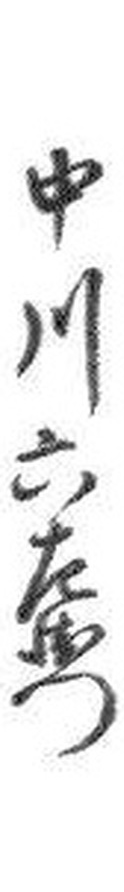中川六左衛門
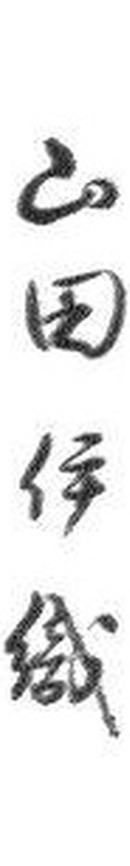山田伊織
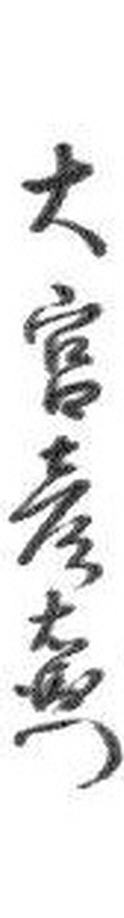大宮彦右衛門
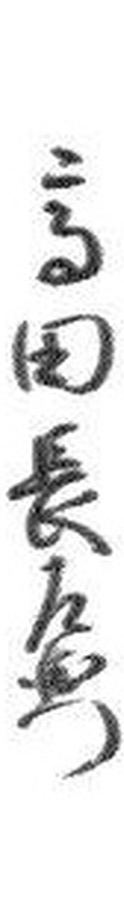高田長左衛門
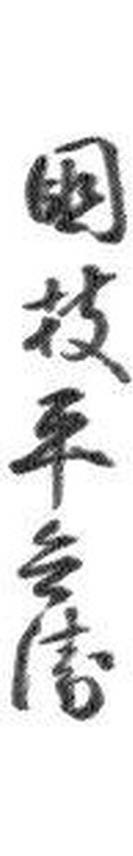国枝平兵衛
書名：家譜 八 光通公 従寛文十年到同十二年
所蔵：福井県文書館 Fukui Prefectural Archives
